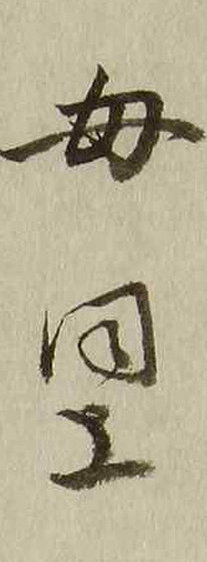母同上
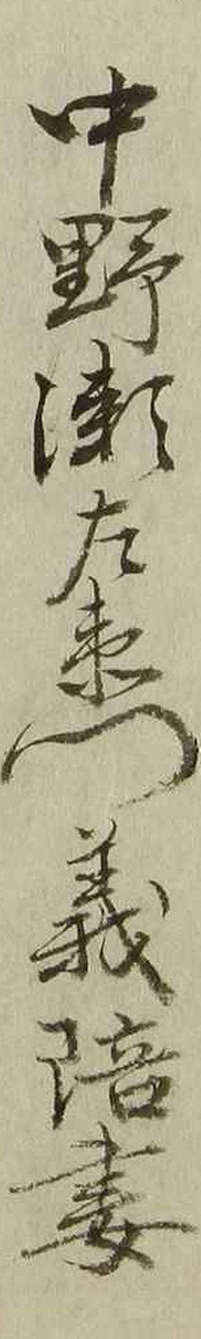女中野瀬左衛門義陪妻
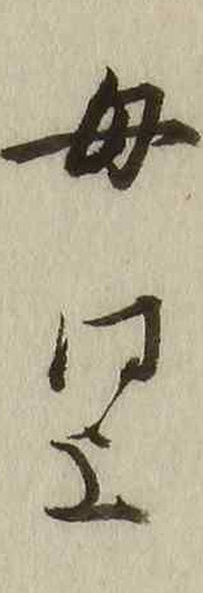母同上
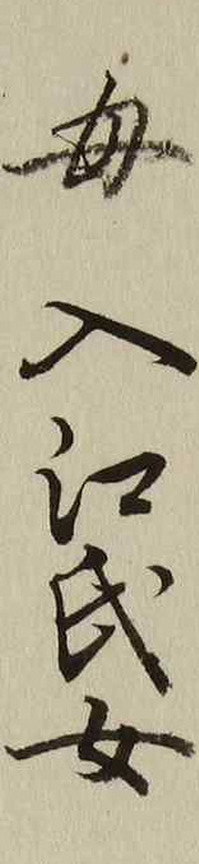母入江氏女
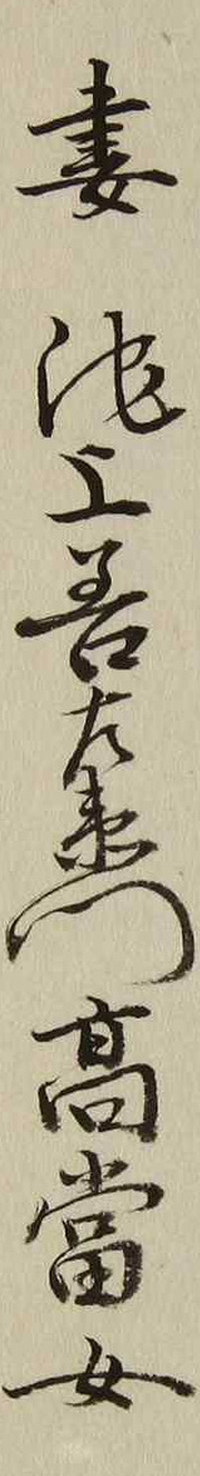妻池上善左衛門高当女
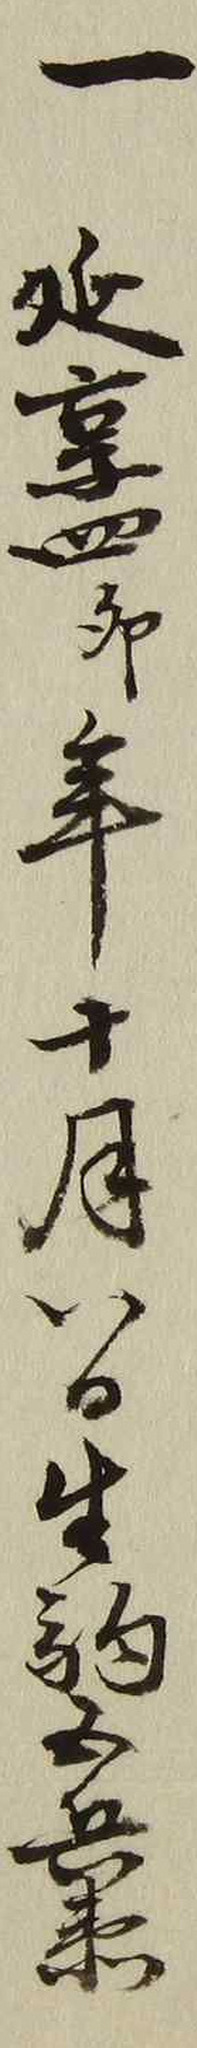一延享四卯年十月八日生駒五兵衛
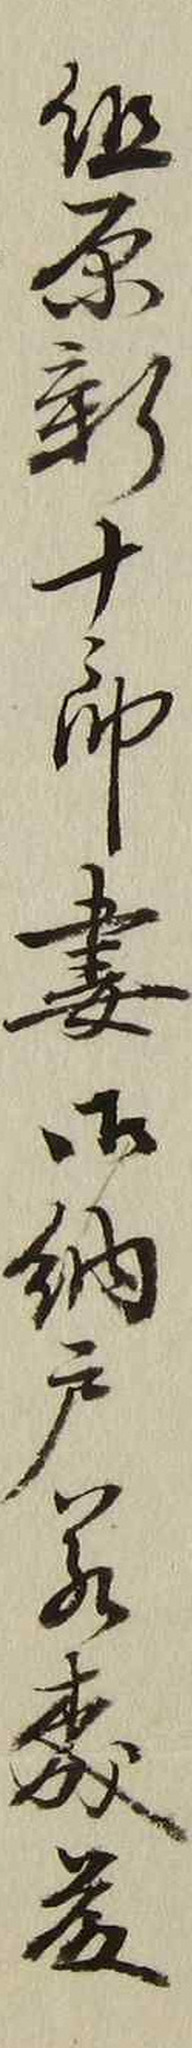組原新十郎妻御納戸若森藤
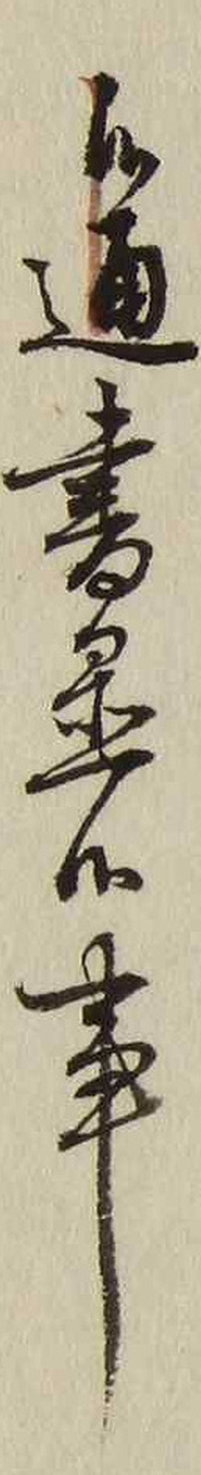候通書置候事

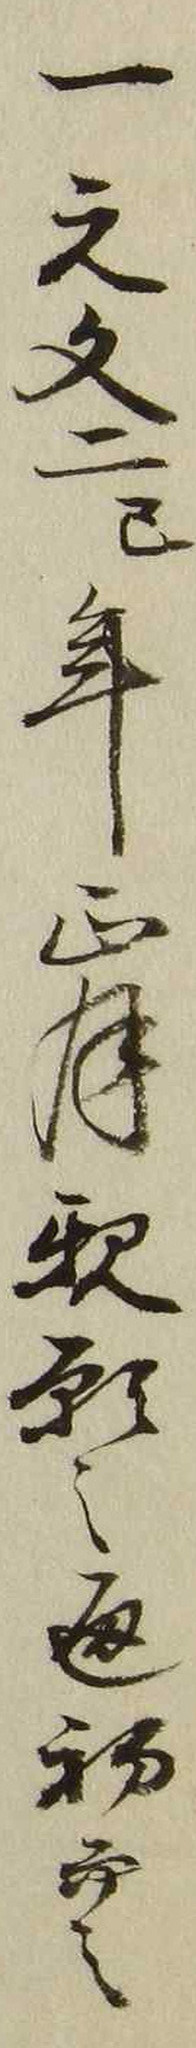一元文二巳年正月親願之通初而之
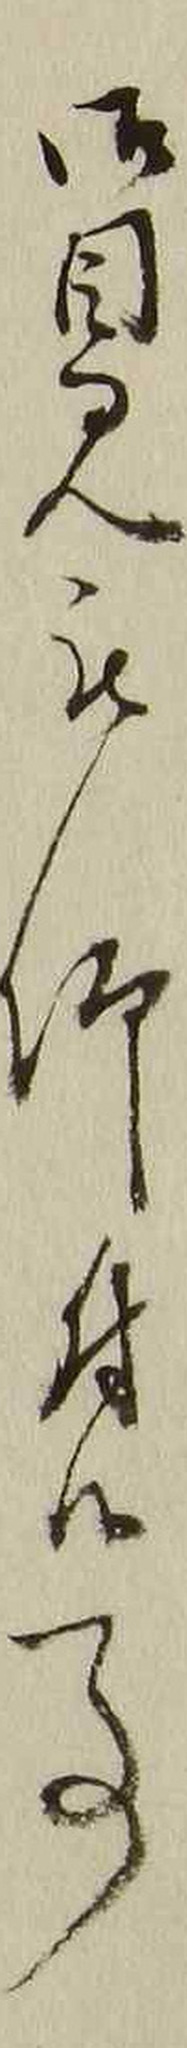御目見被仰付候事
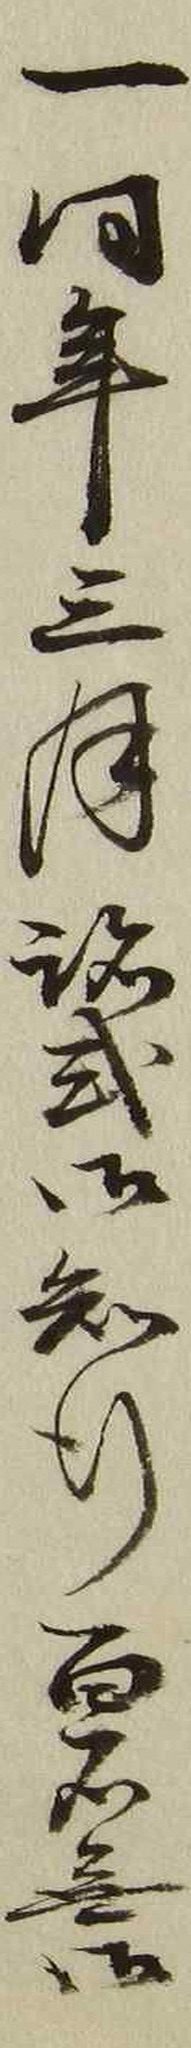一同年三月跡式御知行百石無御
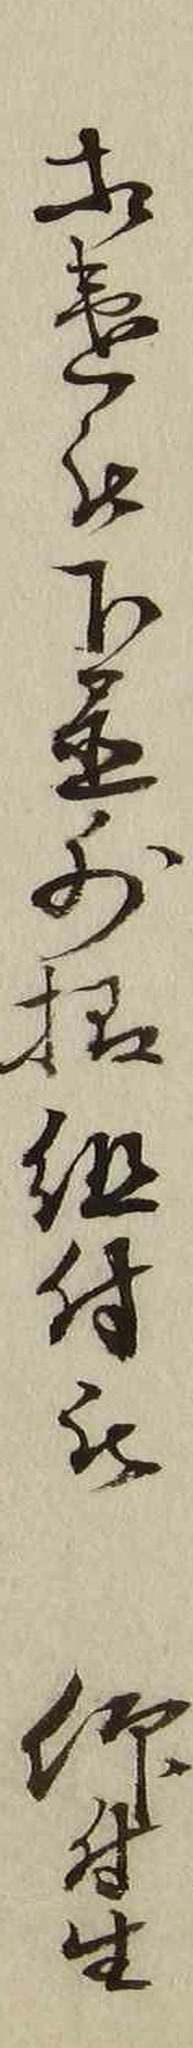相違被下置外様組付被仰付生
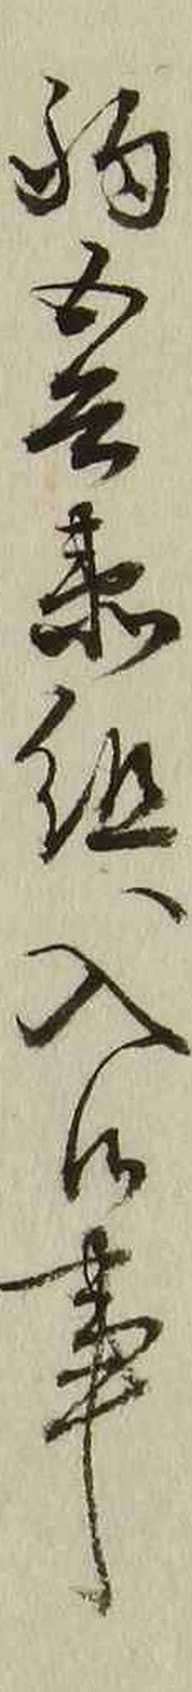駒五衛組へ入候事
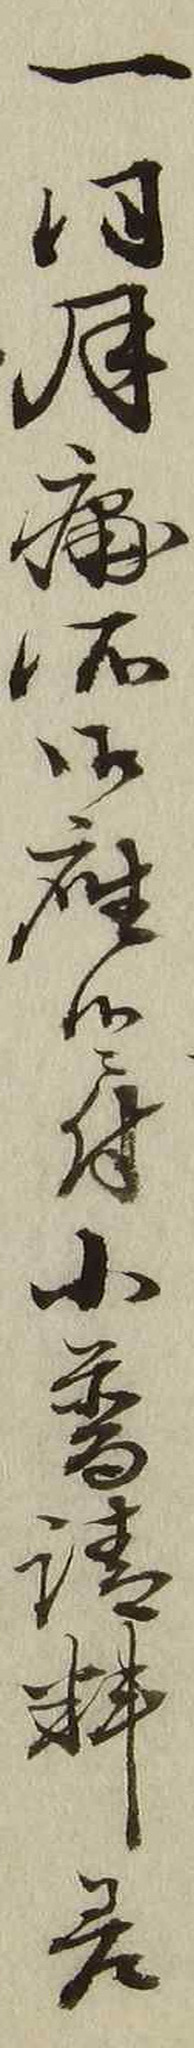一同月痛所御座候ニ付小普請料差
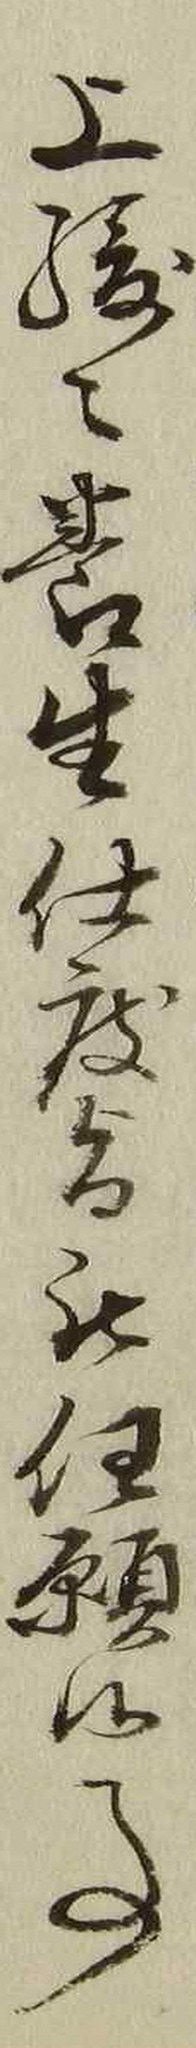上緩々養生仕度旨被任願候事
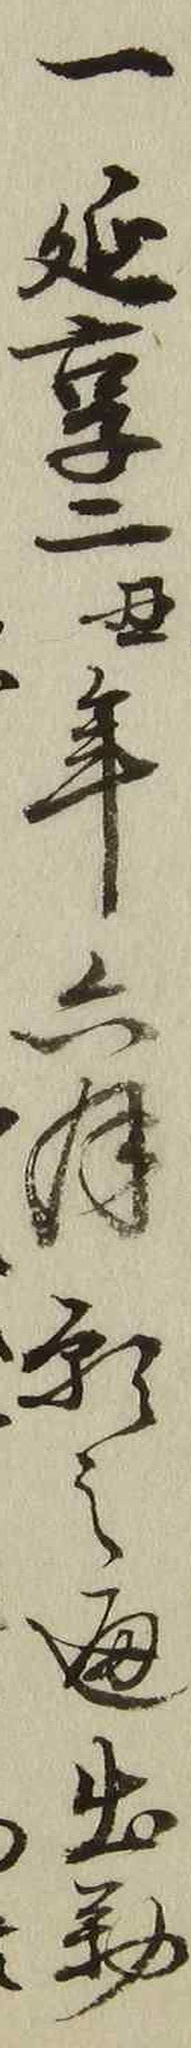一延享二丑年六月願之通出勤
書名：諸士系譜　巻之36　は之部4
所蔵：会津若松市立会津図書館
